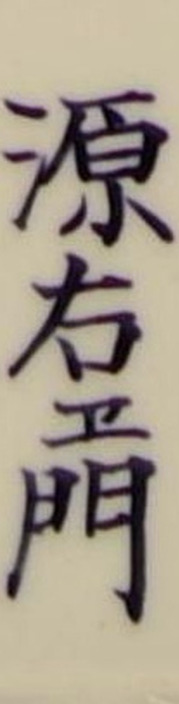源右ヱ門
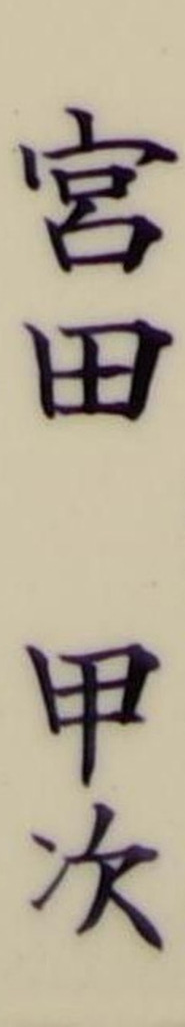宮田甲次
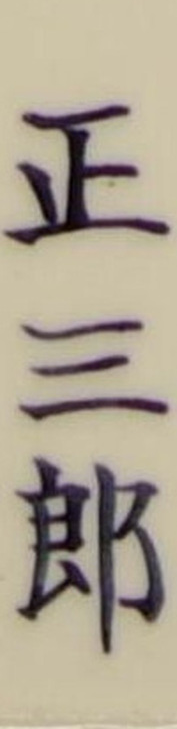正三郎
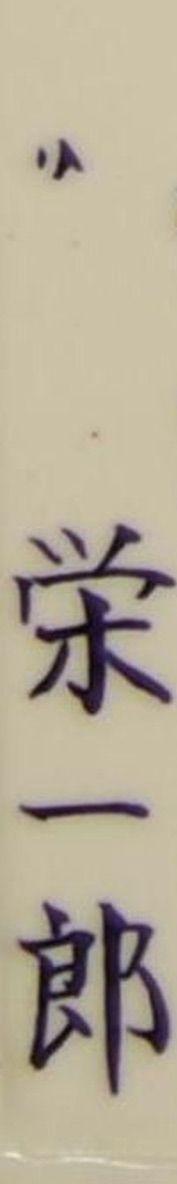栄一郎
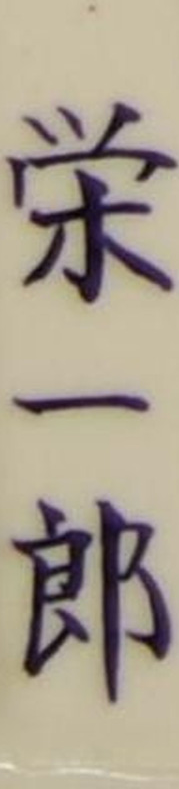栄一郎

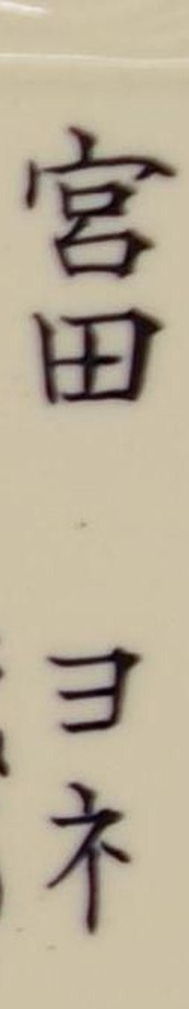宮田ヨネ
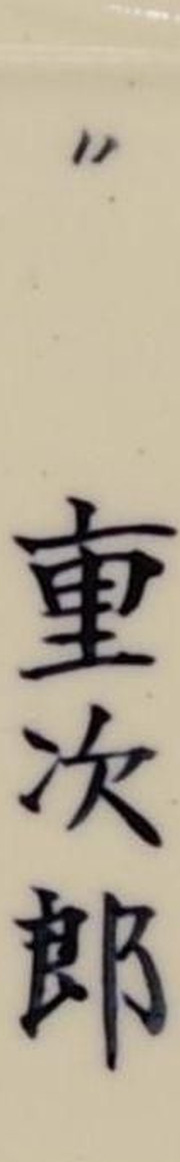重次郎
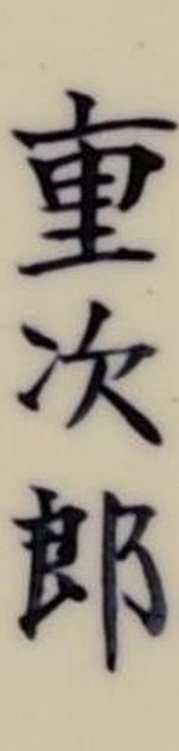重次郎
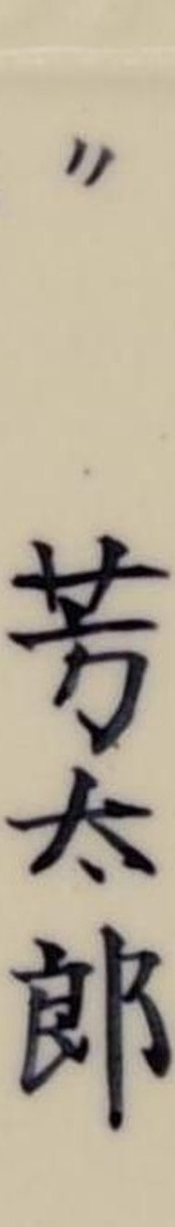芳太郎
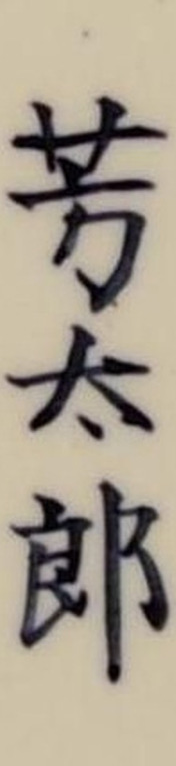芳太郎
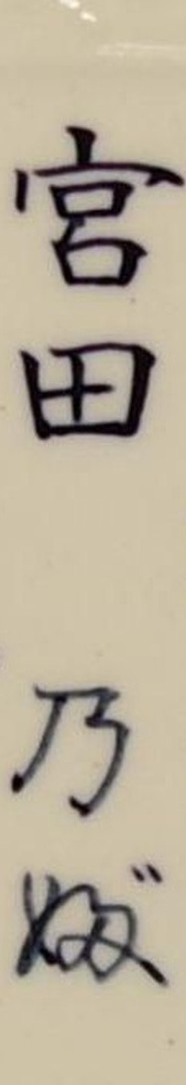宮田のぶ
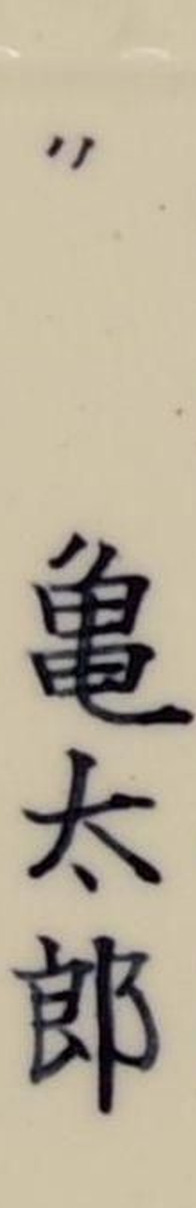亀太郎
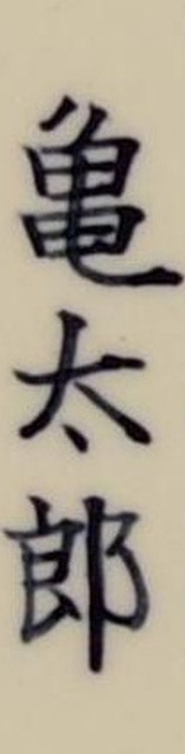亀太郎
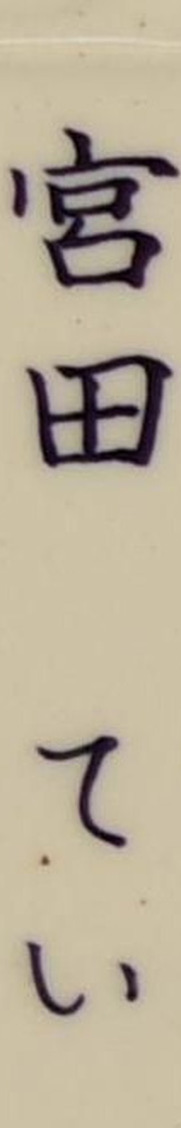宮田てい
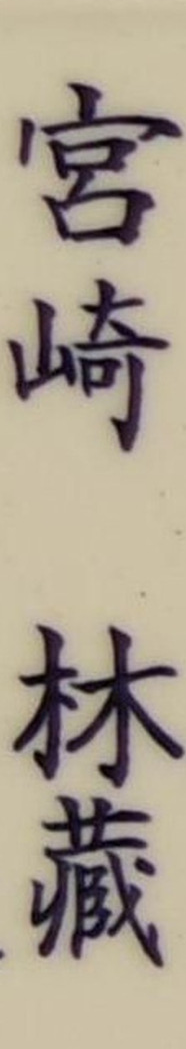宮崎林蔵
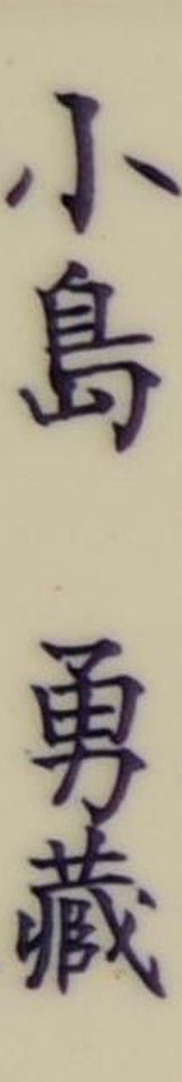小島勇蔵
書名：E~L
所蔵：高野山金剛峯寺
